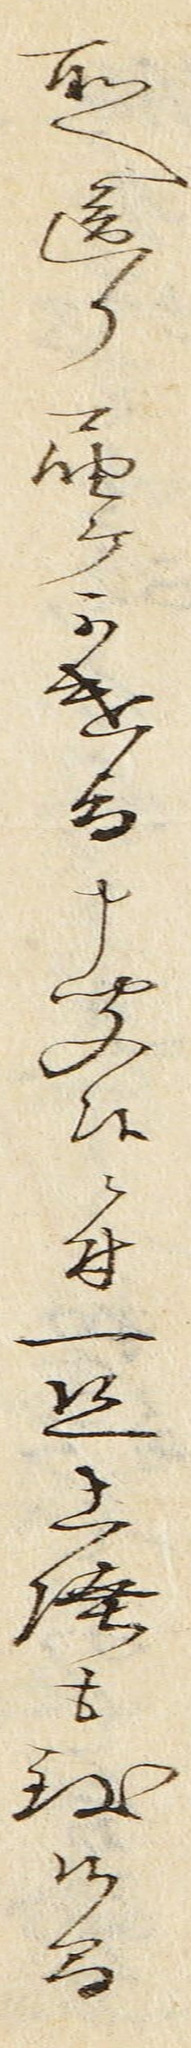所へ送り届ケ可遣旨申聞候に付一旦上陸も致候間
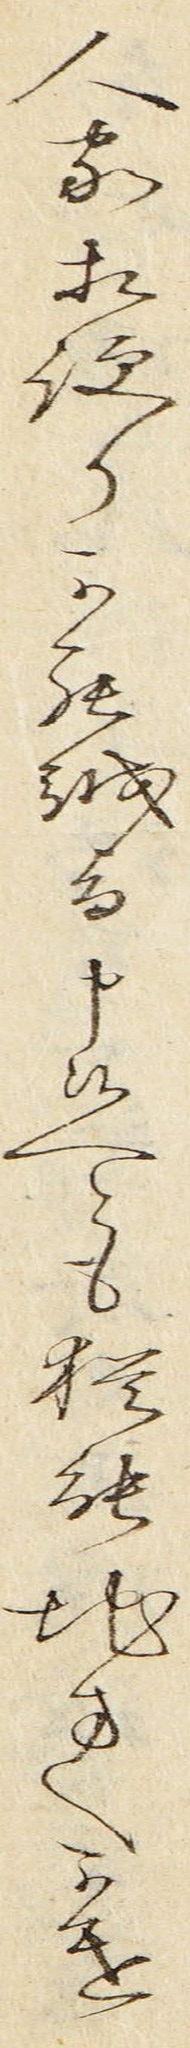人家相便り可罷越旨申候へとも猶能地方へ可遣

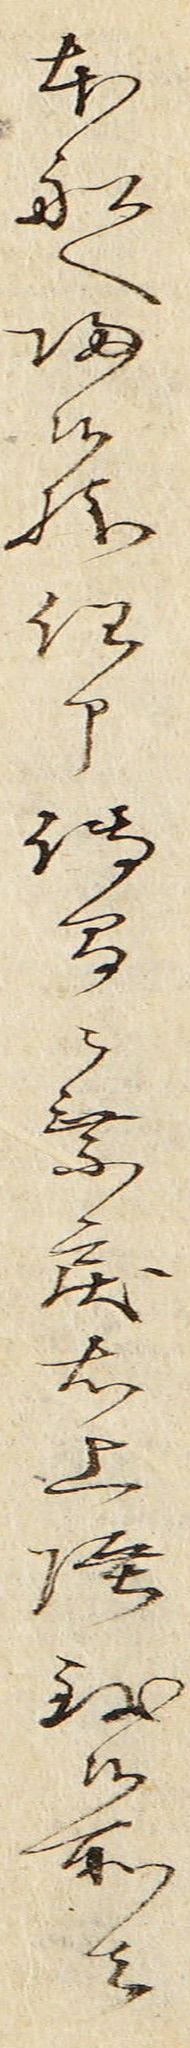本船へ帰候様任申伝間に乗戻右上陸致候所は
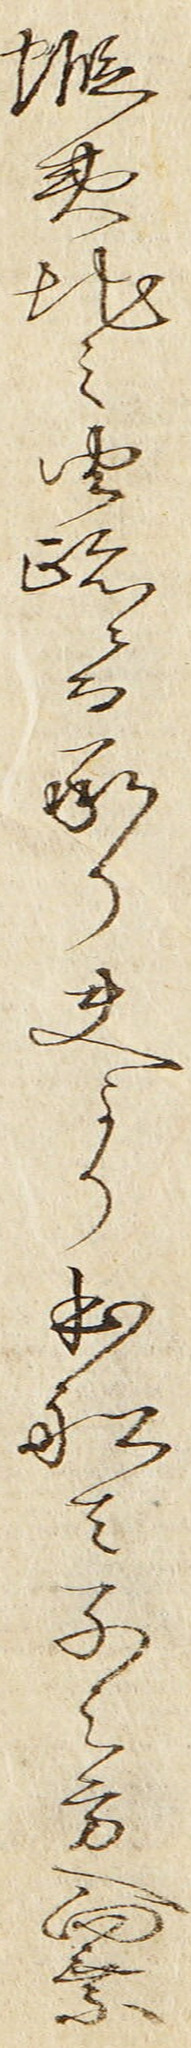蝦夷地之由跡に而承り夫より本船は子之方へ向乗
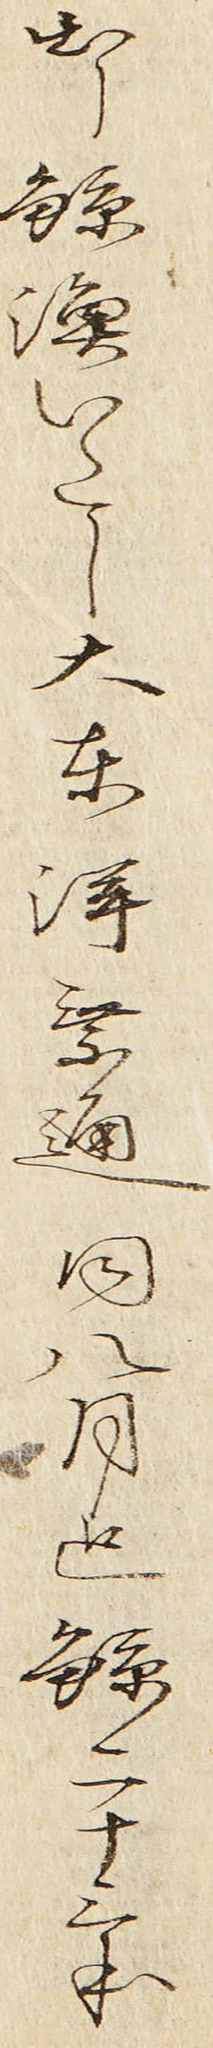出し鯨漁いたし大東洋乗通同八月迄鯨二十三本
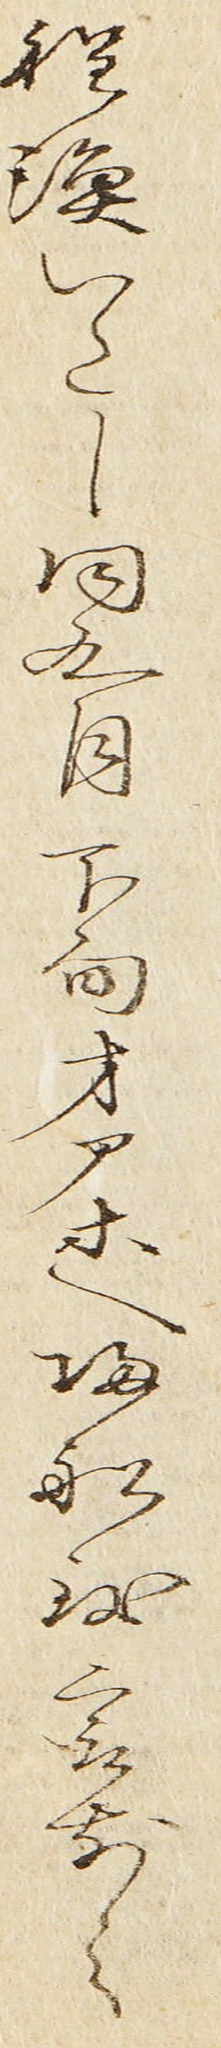程漁いたし同九月下旬オアホへ帰船致最前之
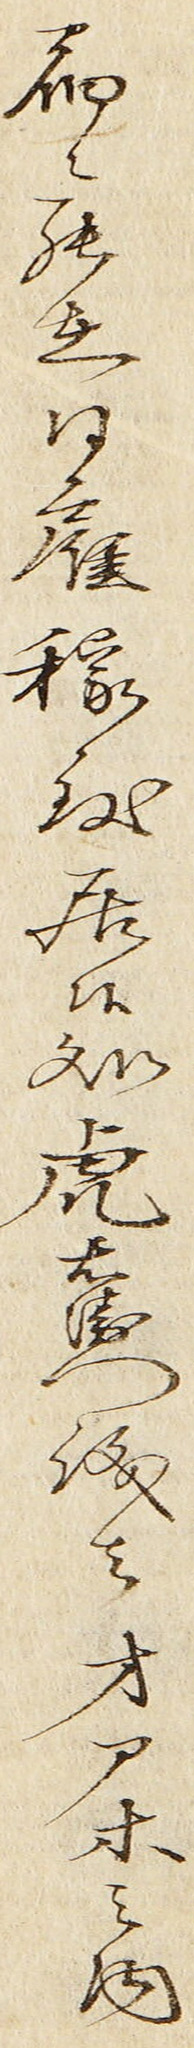宿に罷在日雇稼致折居候処虎右衛門儀はオアホ之内
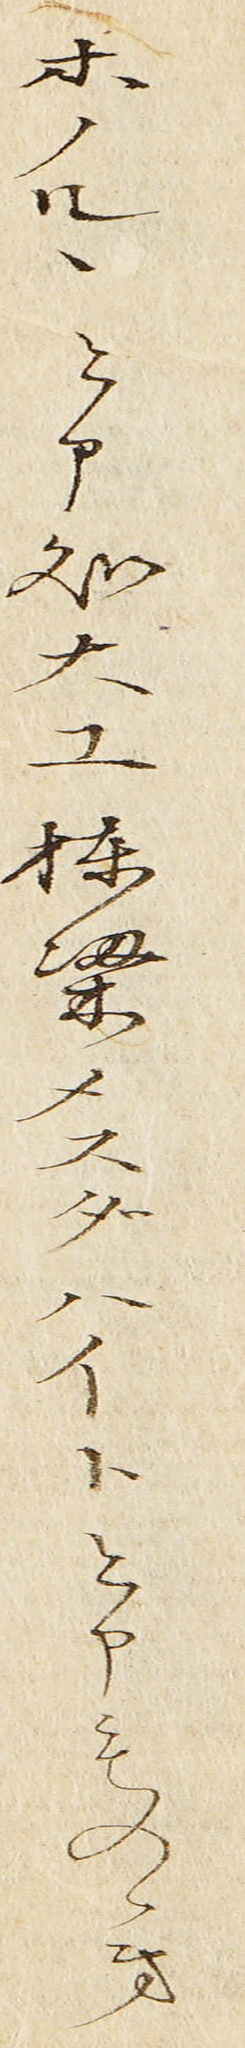ホノルヽと申処大工棟梁メスダハイトと申ものゝ弟
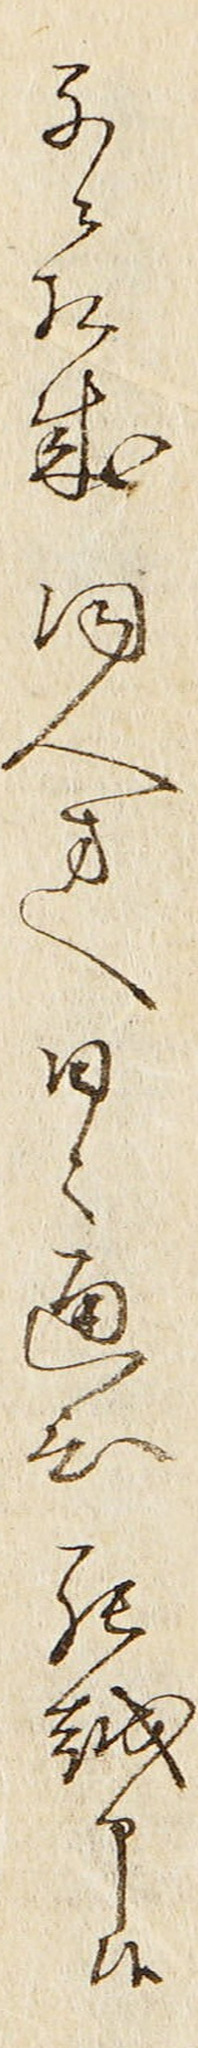子に相成同人方へ日々通ひ罷越申候
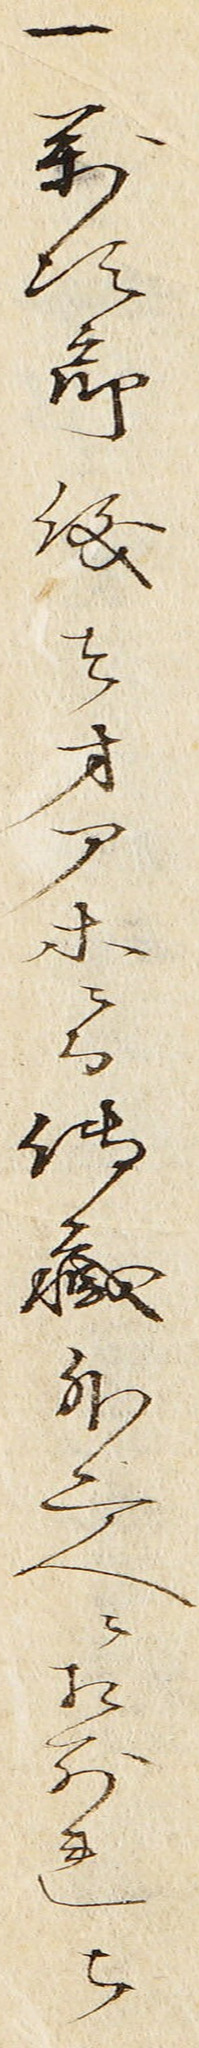一万次郎儀はオアホに而伝蔵外二人に相別れ被
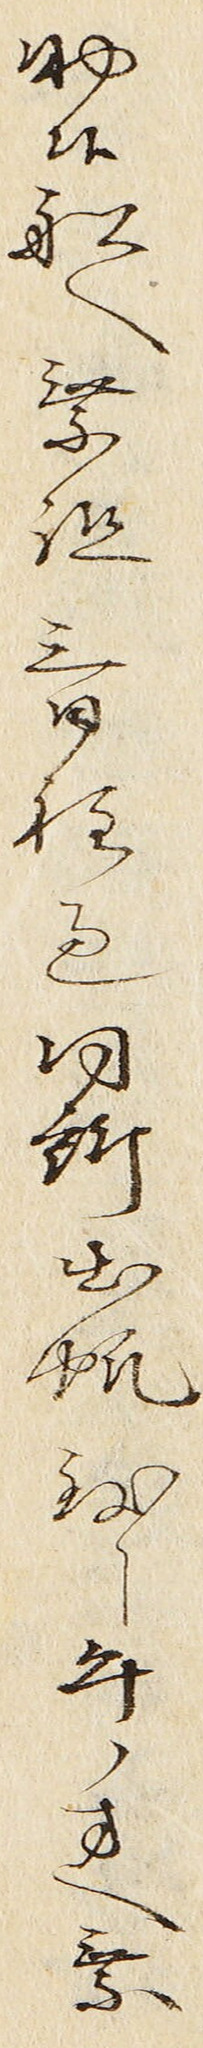助候船へ乗組三日程過同所出帆致し午ノ方へ乗
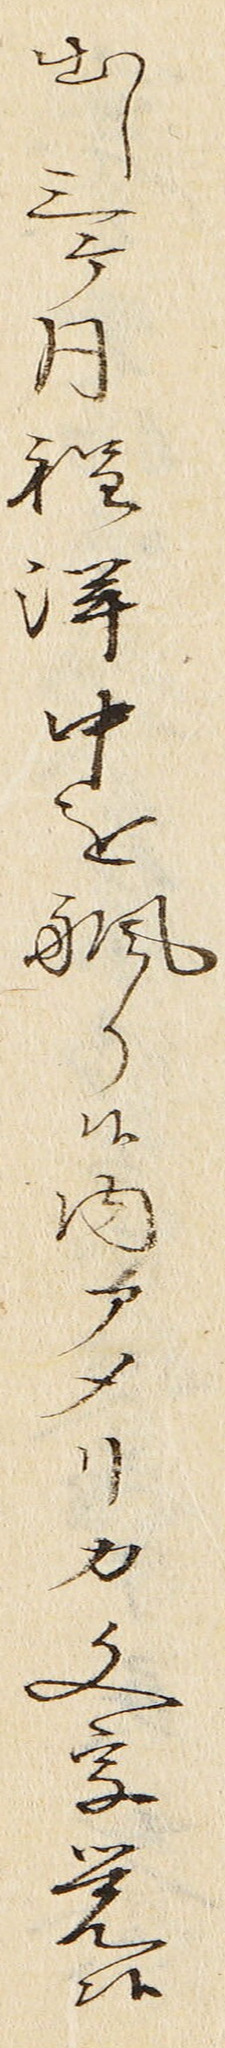出し三ヶ月程洋中を䑺り候内アメリカ文字覚候
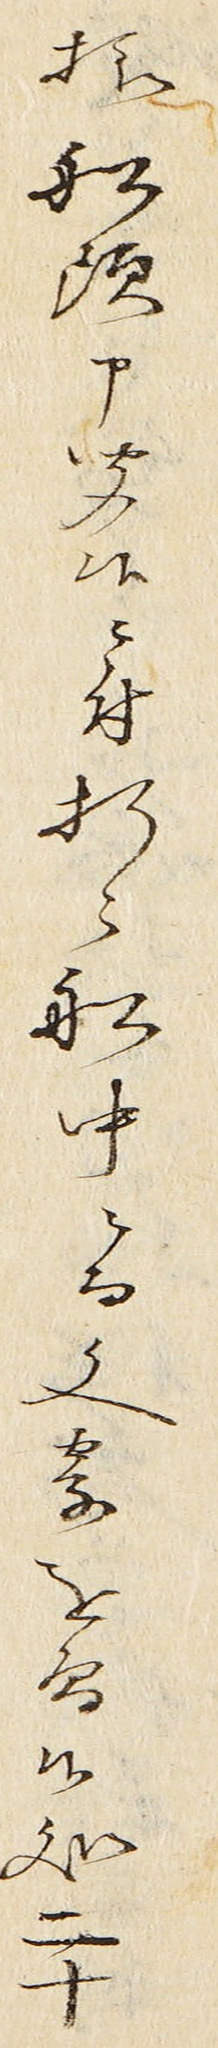様船頭申聞候に付折々船中に而文字を写候処二十
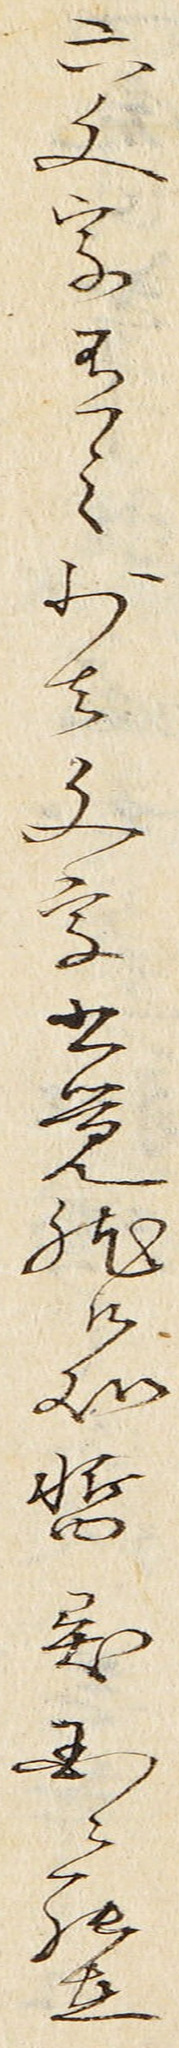六文字有之少は文字書覚然候処暫異国に罷在
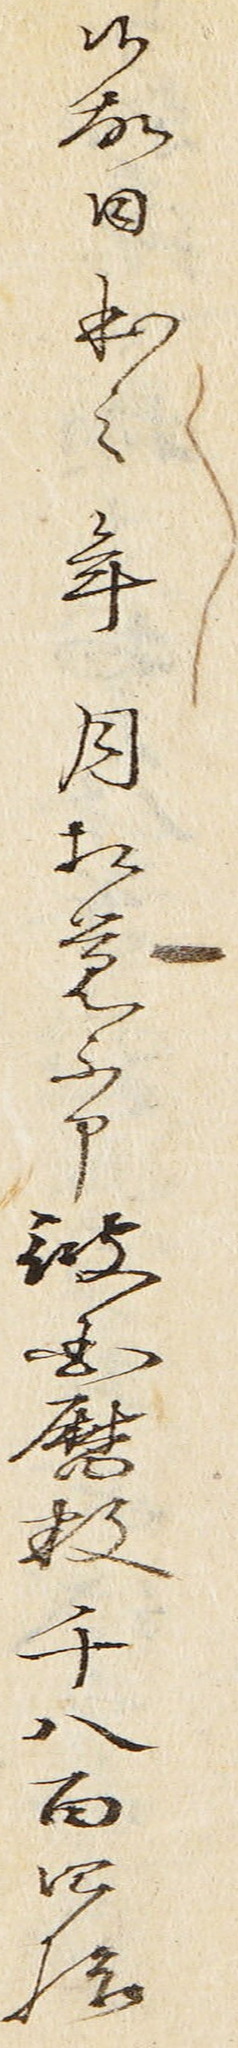候故に日本之年月相覚不申彼国暦数千八百四拾
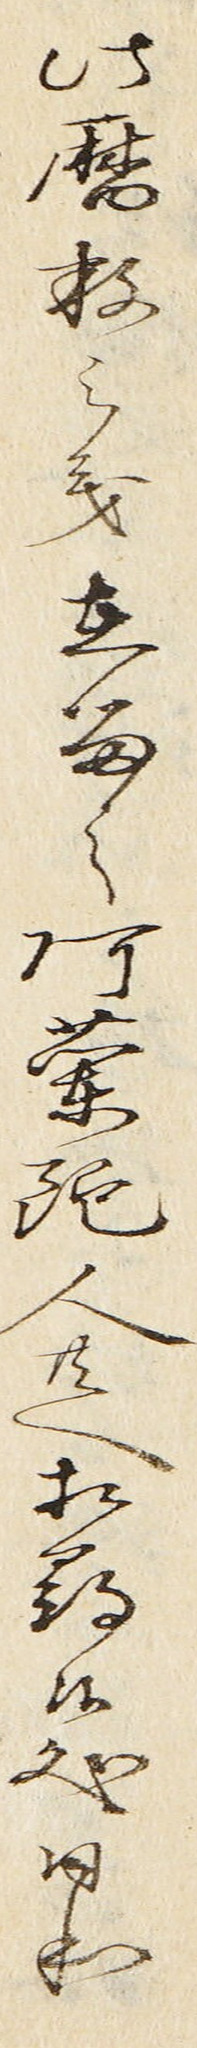此暦数之義在留之阿蘭陀人共へ相尋候処日本
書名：土佐中浜万次郎漂流記
